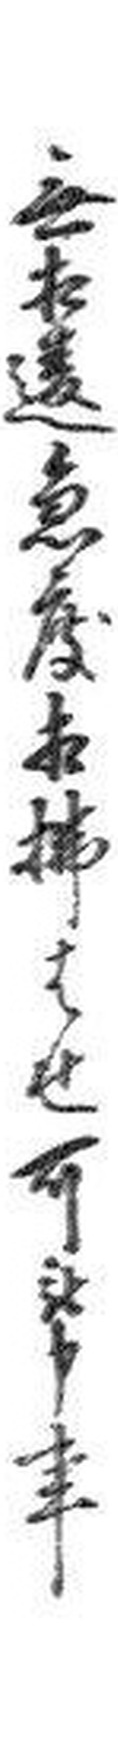無相違急度相払はせ可被申事
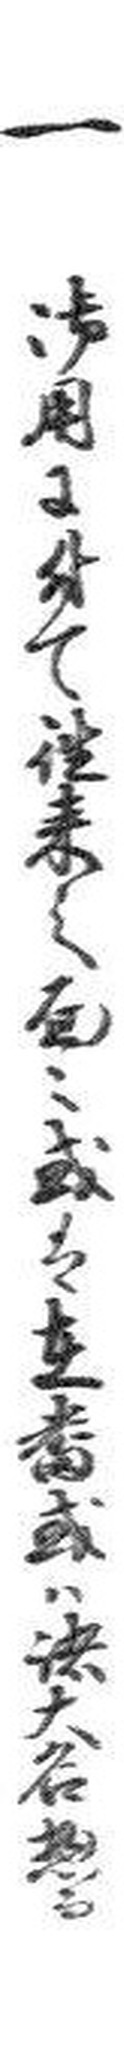一御用に付て往来之面々或は在番或ハ諸大名惣而
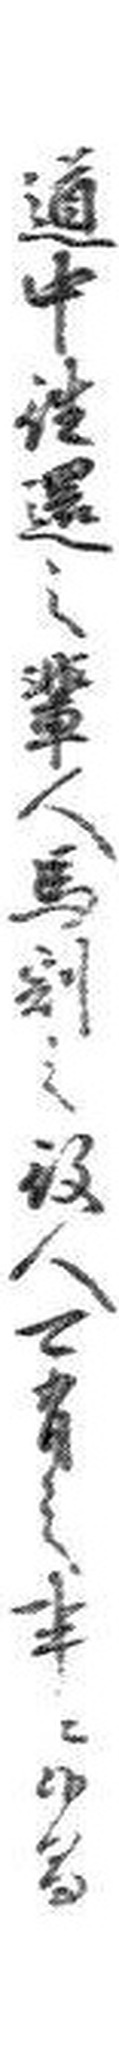道中往還之輩人馬割之役人可有之事ニ候間
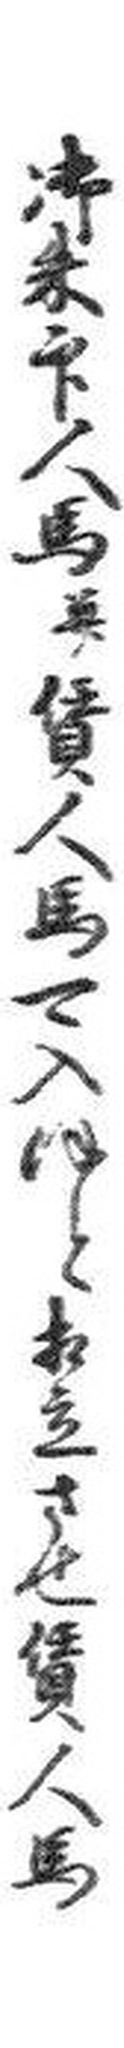御朱印人馬并賃人馬可入ほと相立させ賃人馬
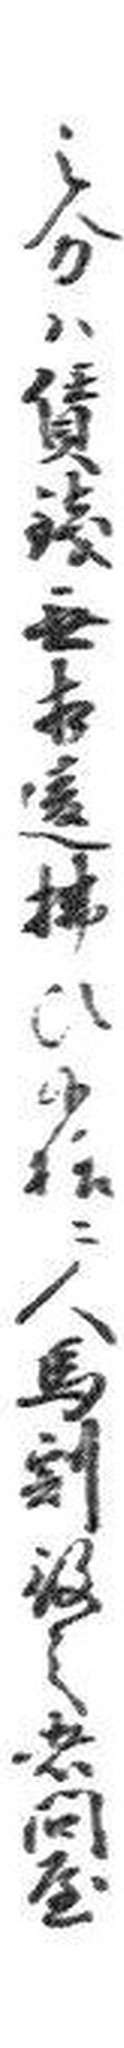之分ハ賃銭無相違払ひ候様ニ人馬割役之者問屋
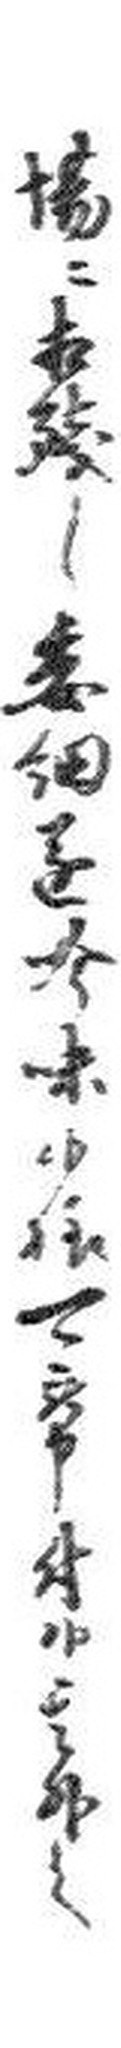場ニ相残し委細遂吟味候様可被申付候其外之
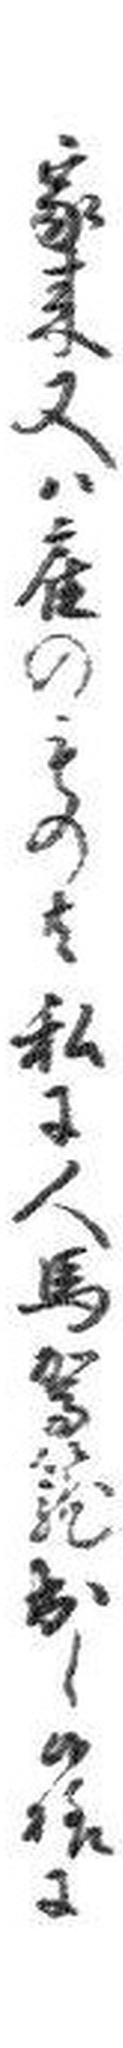家来又ハ雇のもの共私に人馬駕籠出し候様に
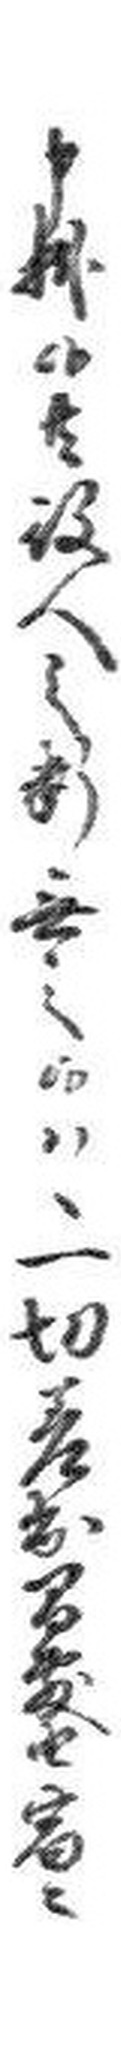申掛候共役人之断無之候ハヽ一切差出間敷由宿々
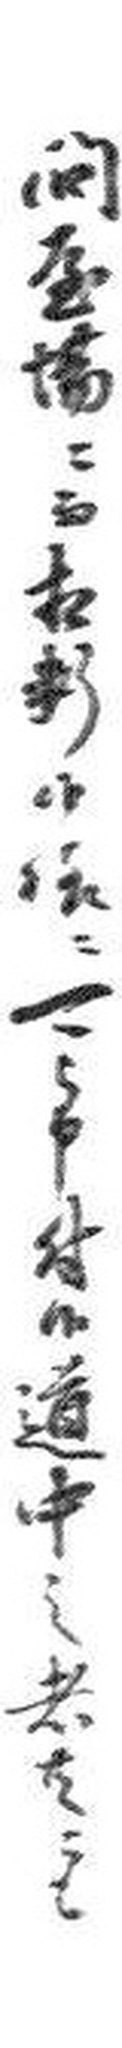問屋場ニ而相断候様ニ可被申付候道中之者共ニ

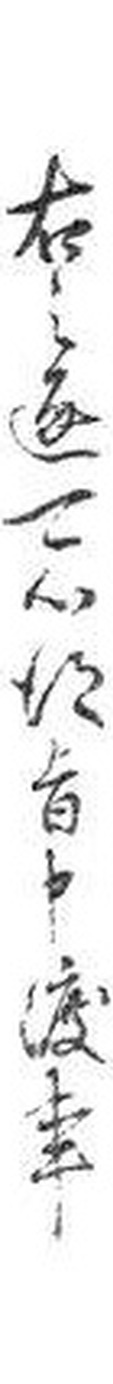右之通可心得旨申渡事
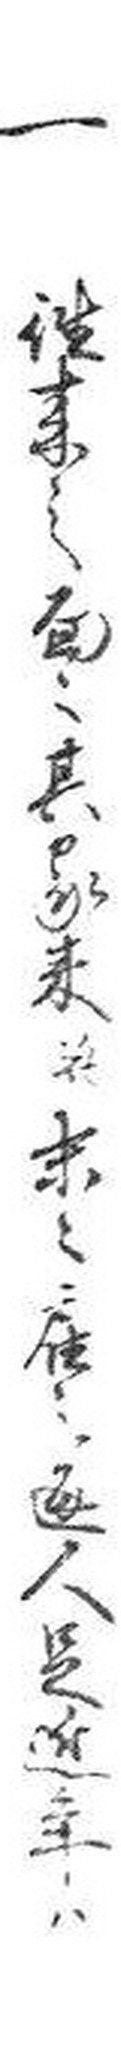一往来之面々其家来并末々雇之通人足近年ㇵ
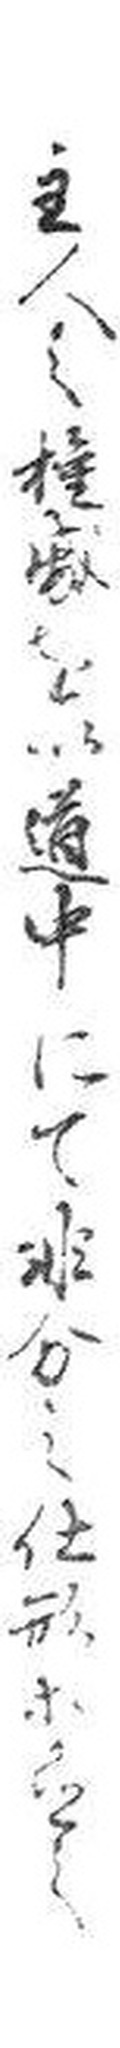主人之権威を以道中にて非分之仕形等有之
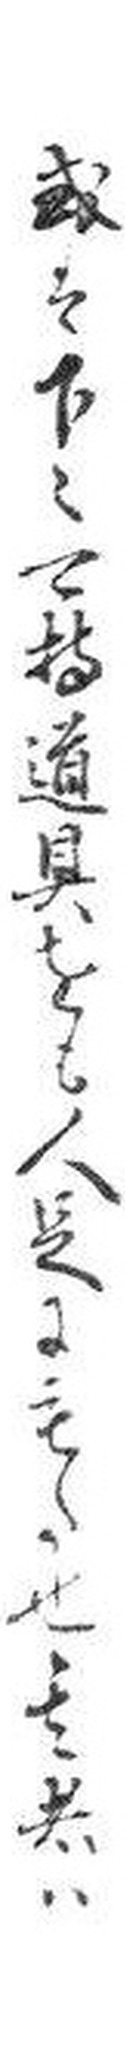或は下々可持道具をも人足にもたせ其者ㇵ
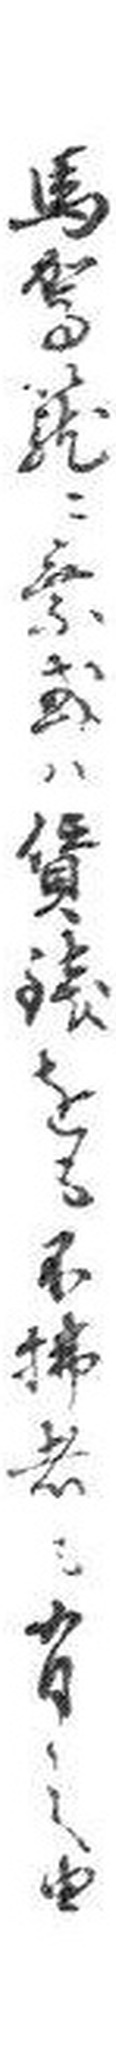馬駕籠ニ乗或ㇵ賃銭をも不払者も有之由
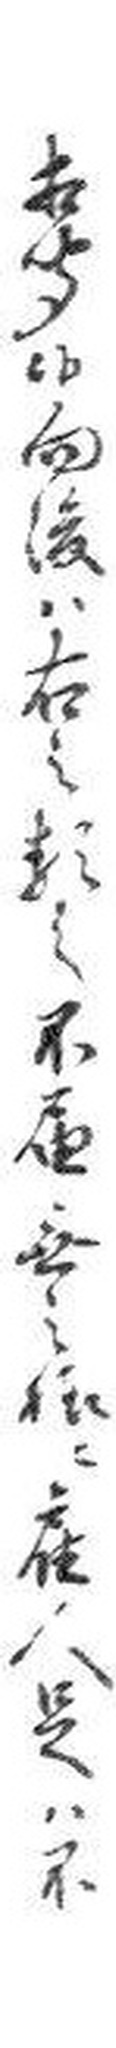相聞候向後ㇵ右之類之不届無之様ニ雇人足ㇵ不
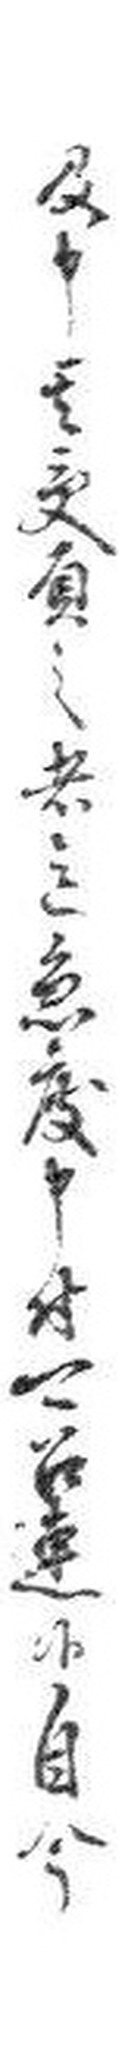及申其受負之者迄急度申付可召連候自今
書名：家譜 二十九 吉邦公 従正徳二年到正徳三年
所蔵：福井県文書館 Fukui Prefectural Archives
